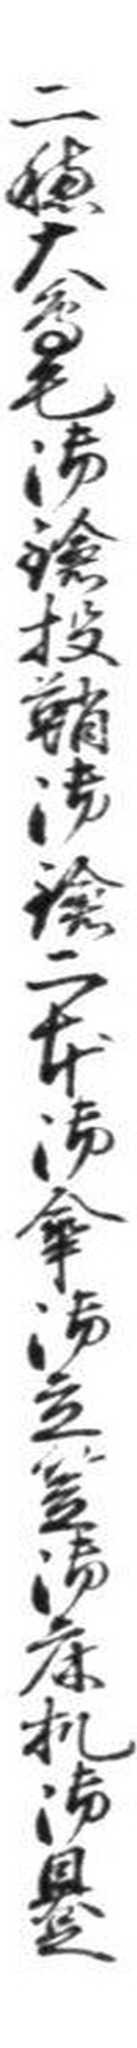二穂大鳥毛御槍投鞘御槍二本御傘御立笠御床机御具足
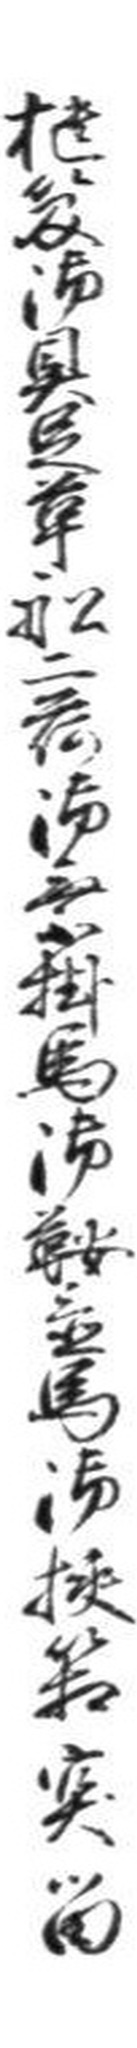櫃笈御具足革船二荷御乗掛馬御鞍置馬御挟箱突留
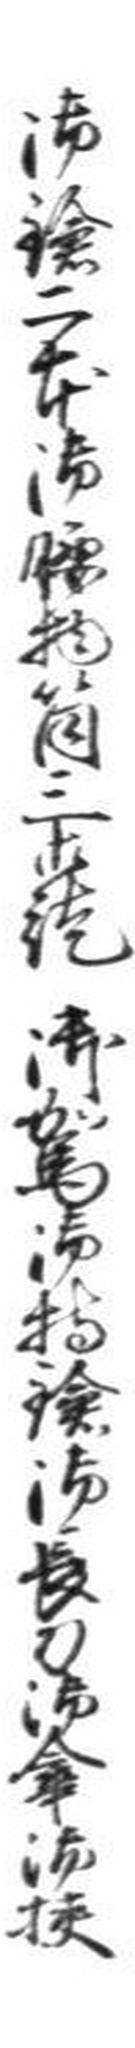御槍二本御腰物筒三御徒御駕御持槍御長刀御傘御挟
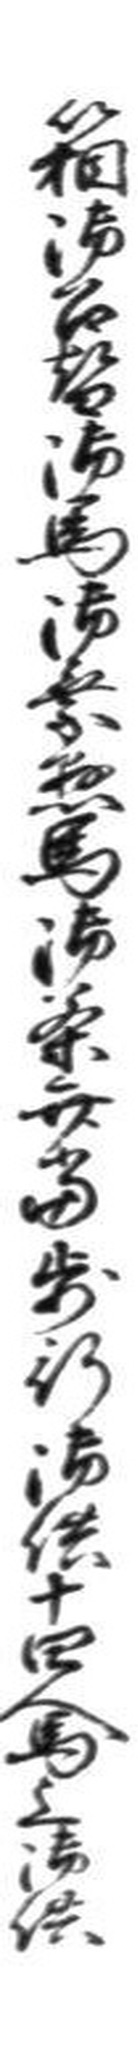箱御召替御馬御乗懸馬御茶弁当歩行御供十四人馬上御供
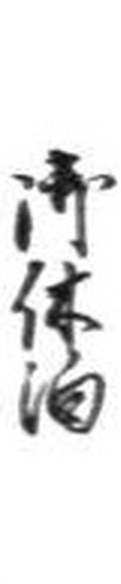御休泊
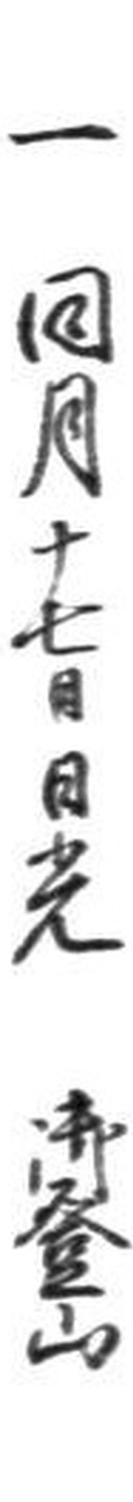一同月十七日日光御登山
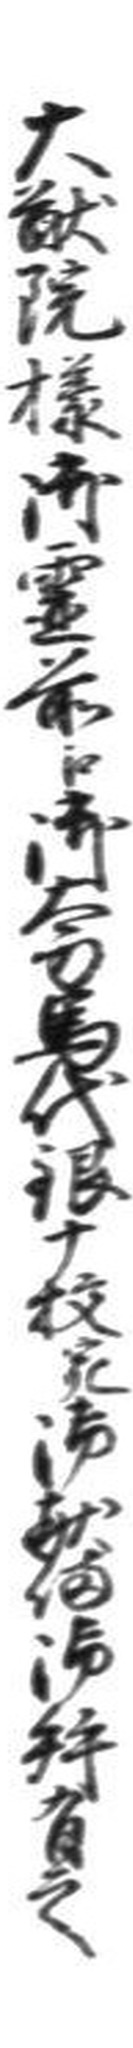大猷院様御霊前江御太刀馬代銀十枚宛御献備御拝有之

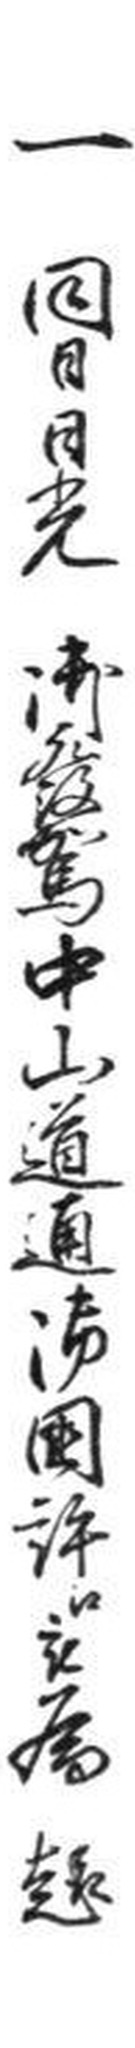一同日日光御発駕中山道通御国許江被為趣
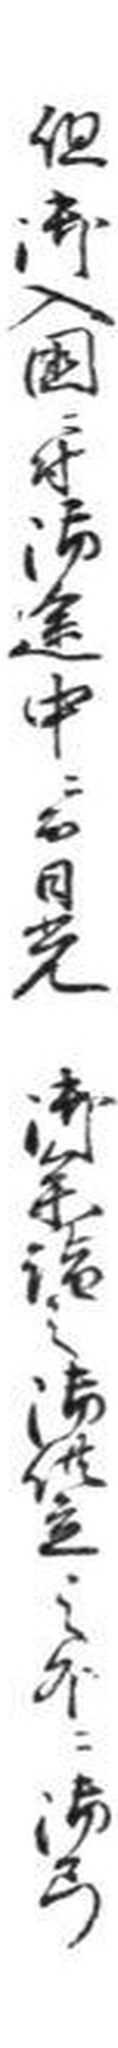但御入国ニ付御途中ニ而日光御参詣之御供立之外ニ御弓
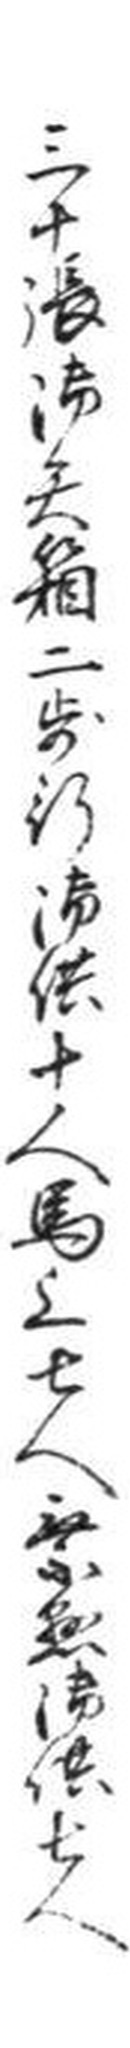三十張御矢箱二歩行御供十人馬上七人乗懸御供七人
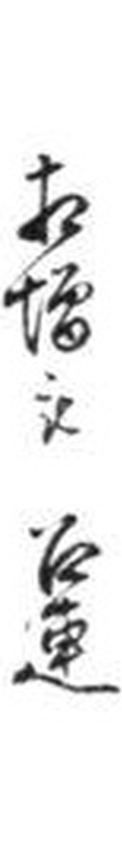相増被召連
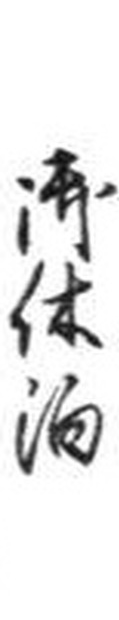御休泊
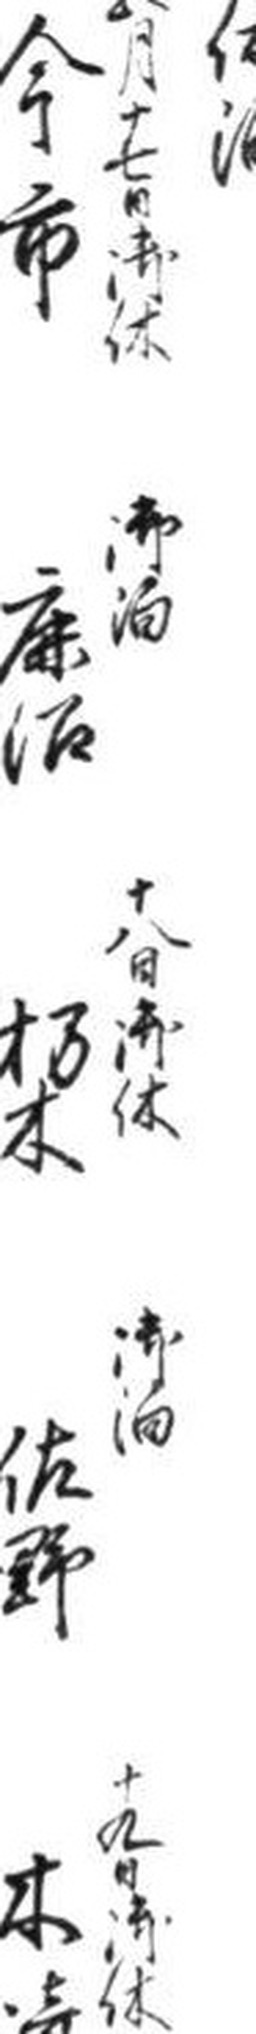今市鹿沼栃木佐野木崎
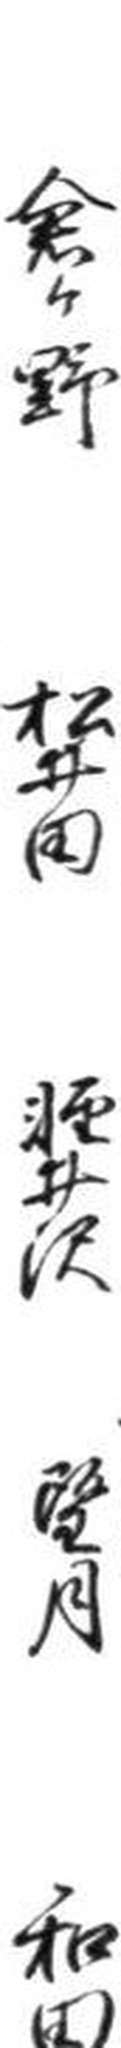倉ヶ野松井田軽井沢望月和田
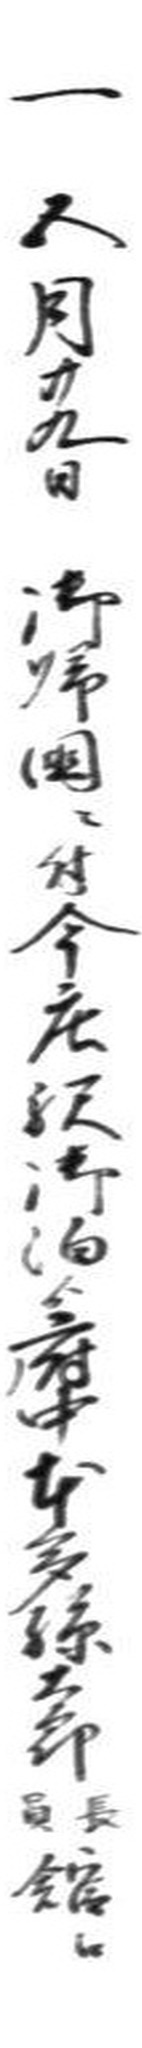一五月廿九日御帰国ニ付今庄駅御泊ゟ府中本多孫太郎長員館江
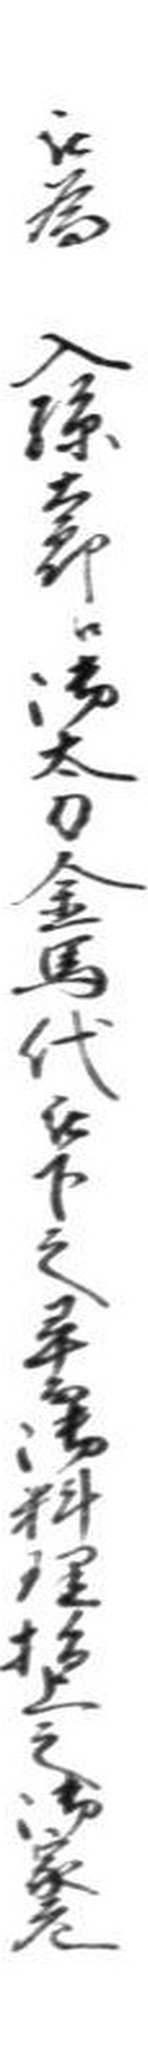被為入孫太郎江御太刀金馬代被下之畢而御料理指上之御家老
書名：家譜 十三 綱昌公 従寛文元年到延宝五年
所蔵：福井県文書館 Fukui Prefectural Archives
